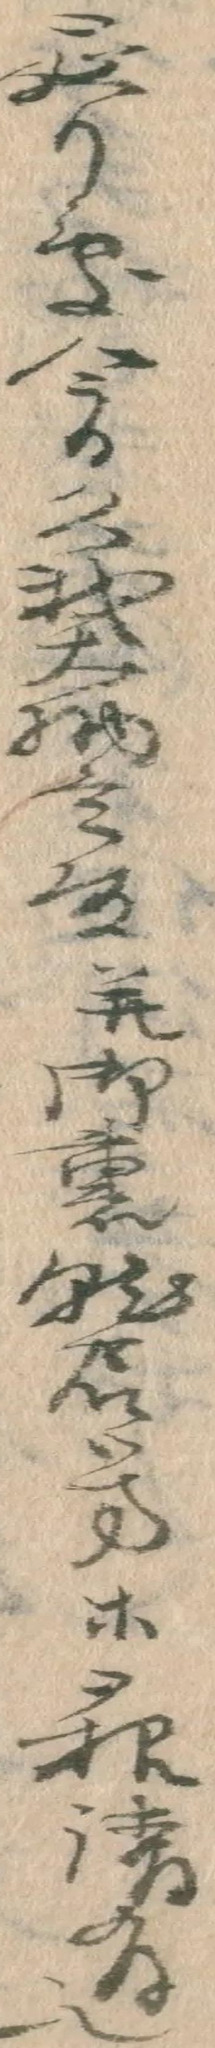承り處今日久我大納言殿并御裏野尼御方等御招請有之
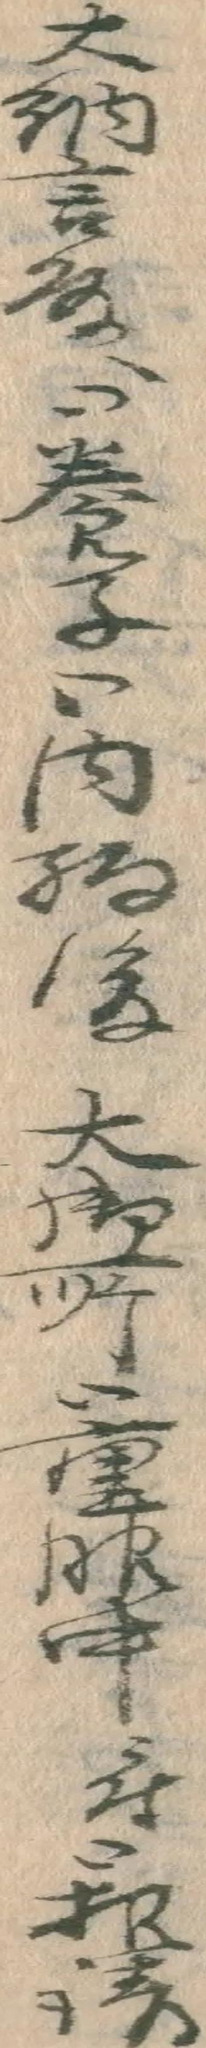大納言殿へ御養子御内約後大御所御重服中ニ付御招請
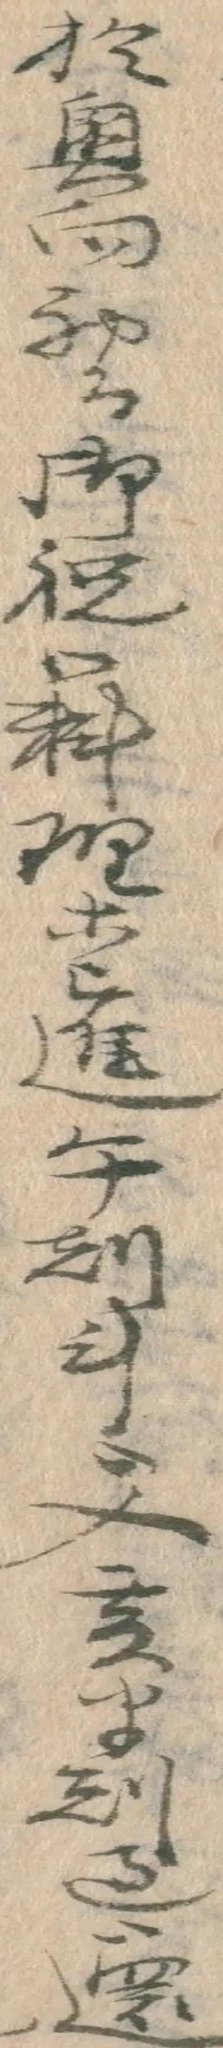於奥向初而御祝御料理等被進午刻斗に入亥半刻過御遷
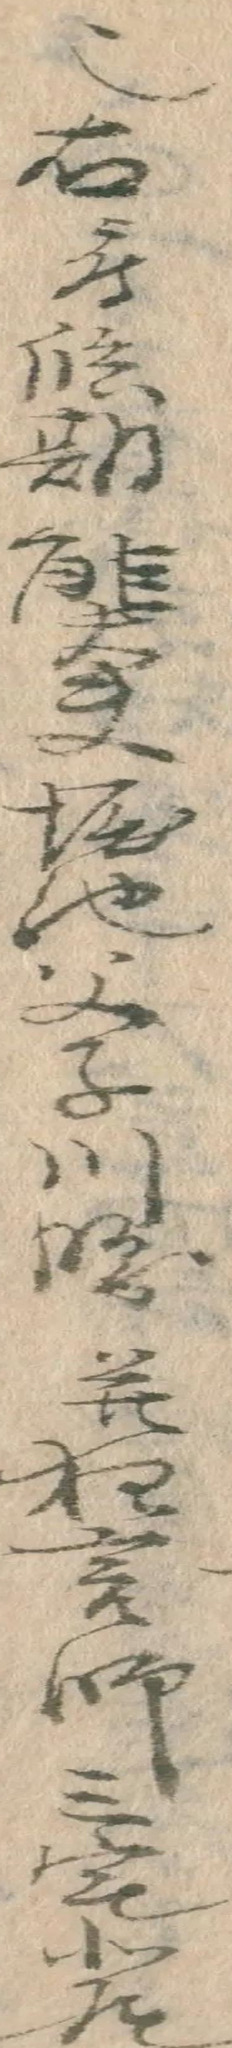也右ニ付臨期熊大夫堀池父子川勝并狂言師三宅北屋
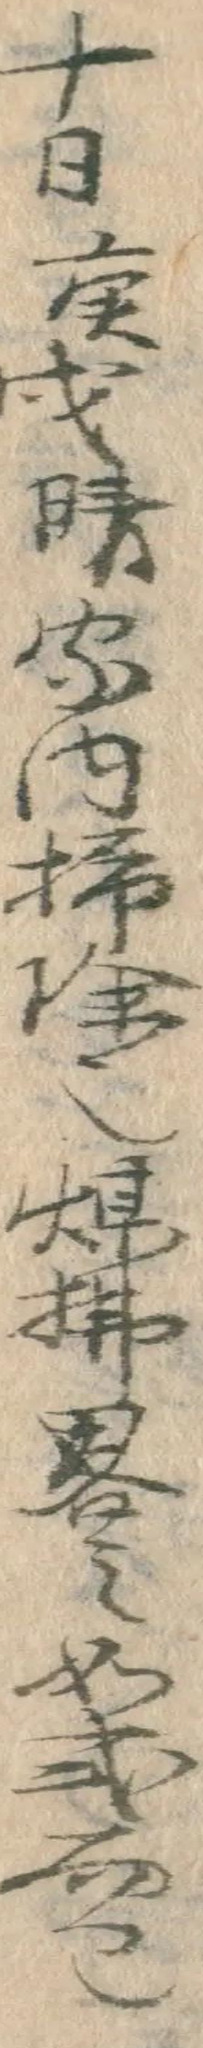十日庚戌晴家内掃除也煤払略之如或而已
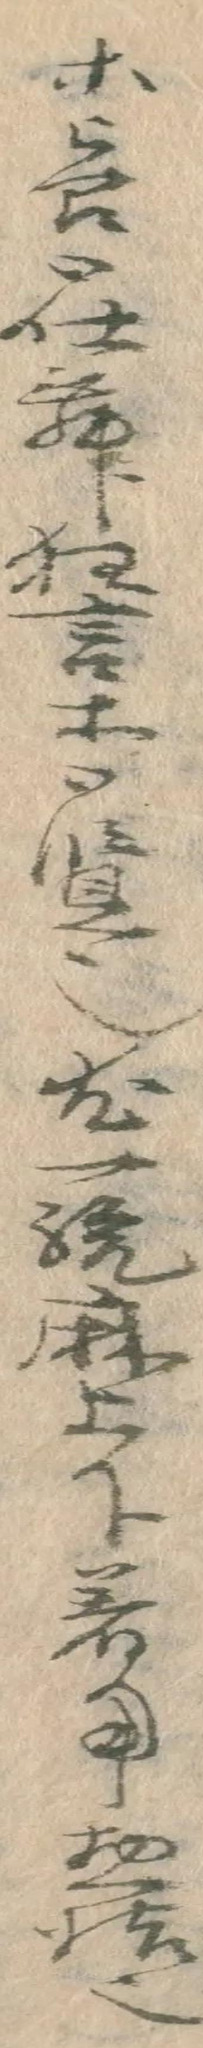等被召御仕舞狂言等御覧也尤一統麻上下着用惣詰也

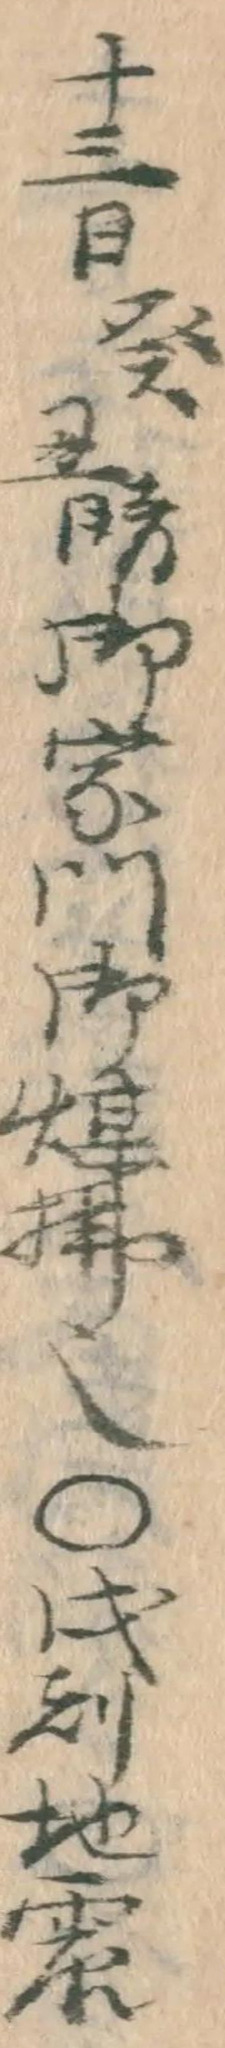十三日癸丑晴御家門御煤払也○戌刻地震
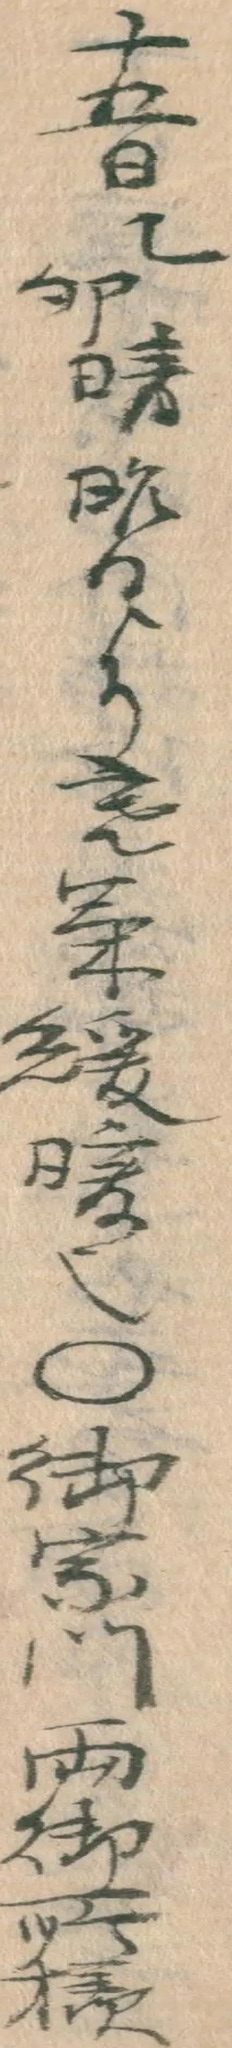十五日乙申晴昨日より寒気緩暖也○御家門両御所様
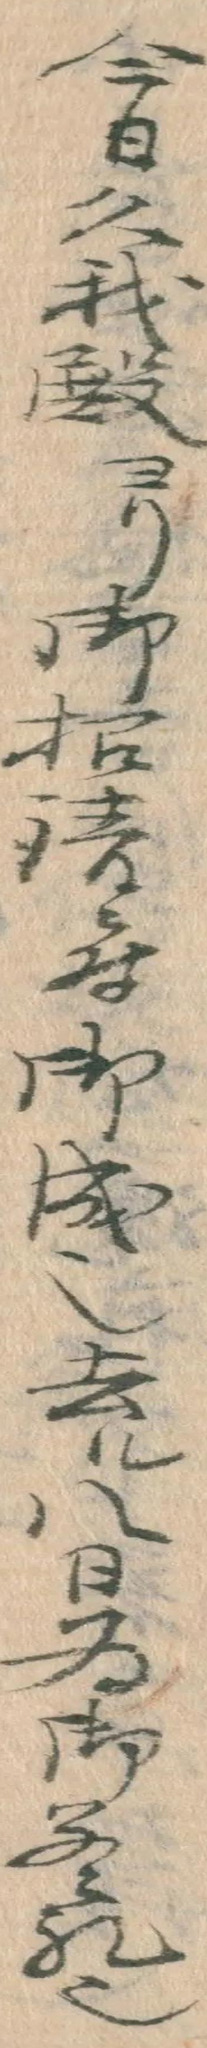今日久我殿ヨリ御招請ニ付御成也去ル八日為御答礼也
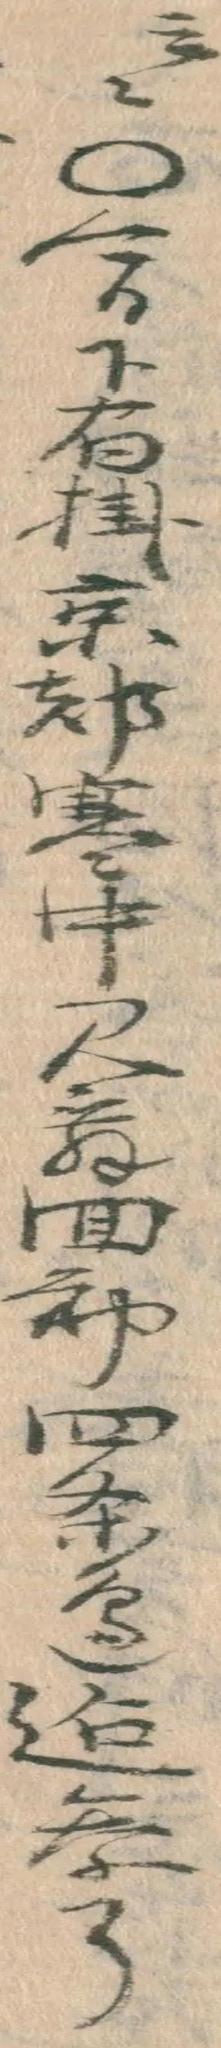云々○今日下宿掛京都寒中見舞回勤四条辺迄参了
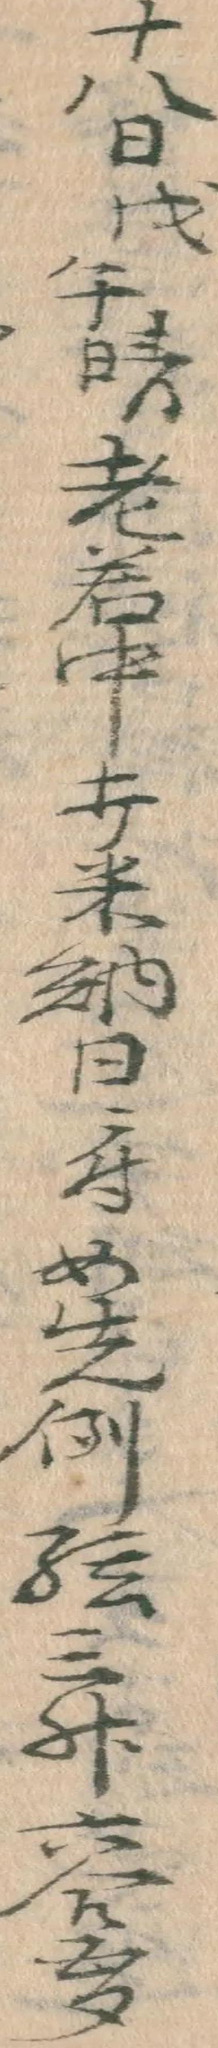十八日戊午晴老若中打米納日ニ付如先例弦三升六合五勺
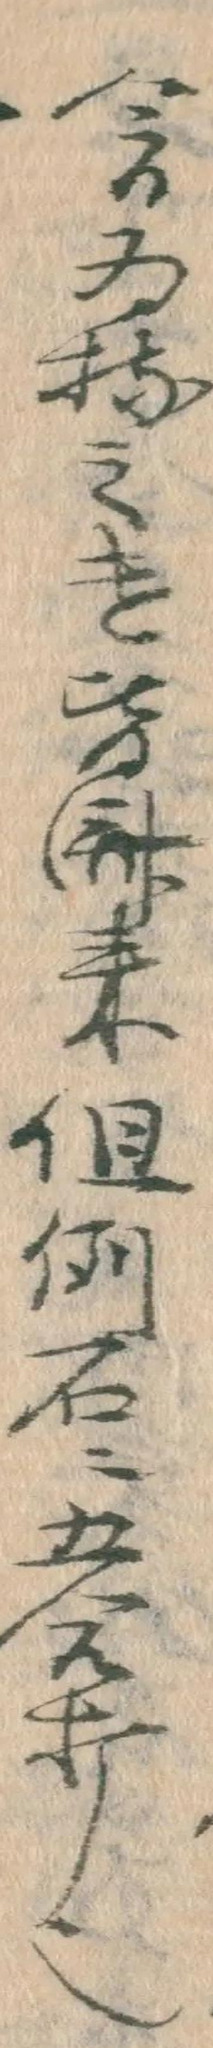今日為持之遣皆済来但例石ニ五合打也
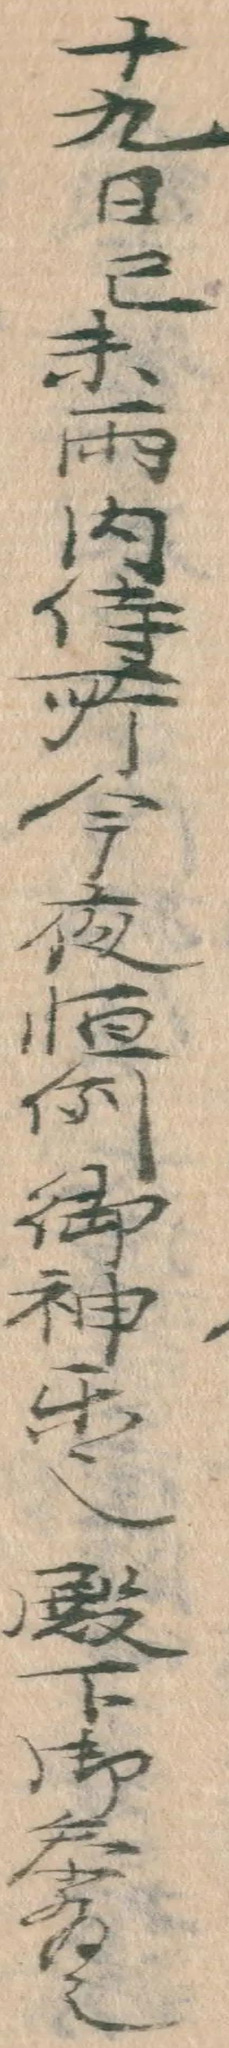十九日己未雨内侍所今夜恒例御神楽也殿下御参有之
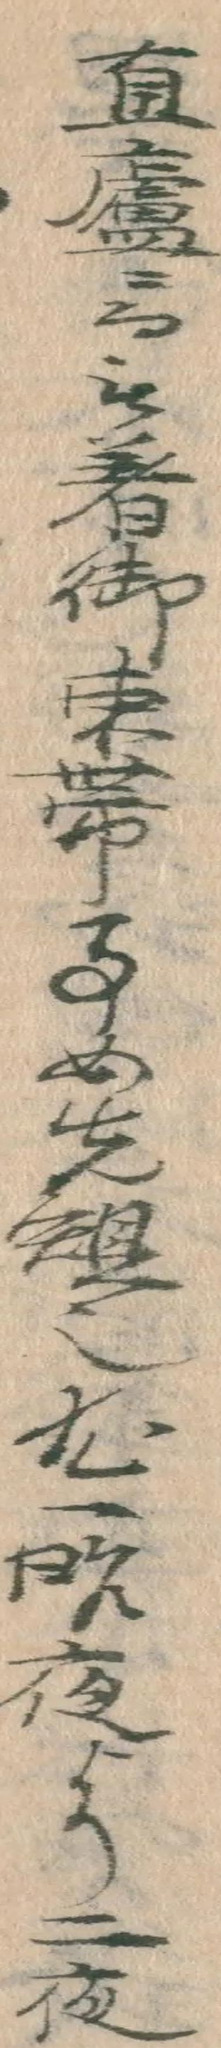直廬ニ而被着御束帯事如先規也尤一昨夜より二夜
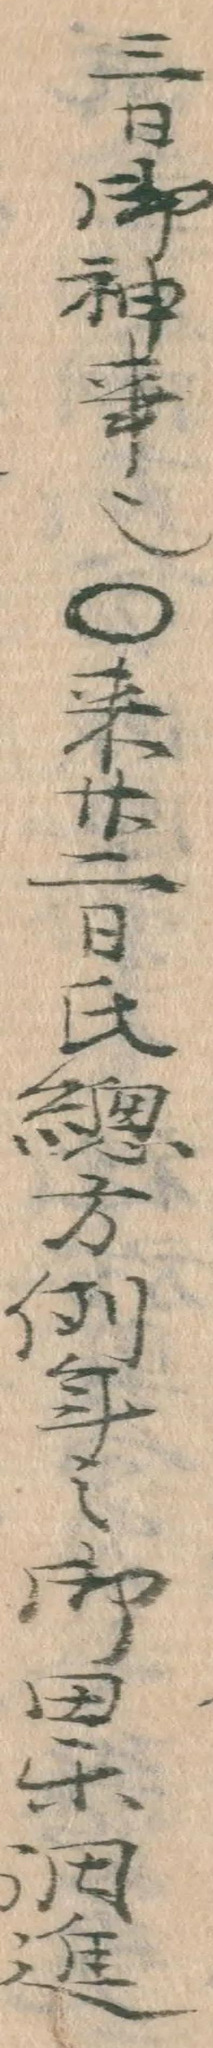三日御神事也○来廿二日氏總方例年之御田楽調進
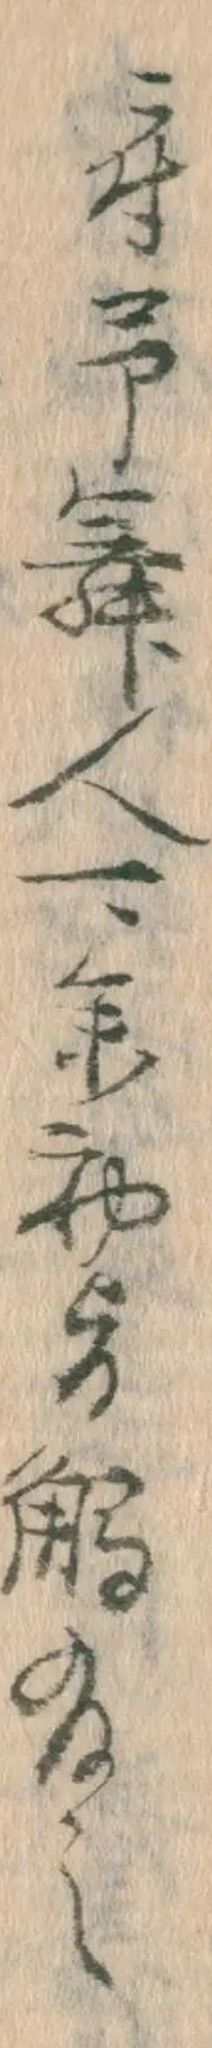ニ付予舞人可参初旨触有之
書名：賀茂社記録. 第63冊
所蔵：国立国会図書館 National Diet Library, JAPAN
